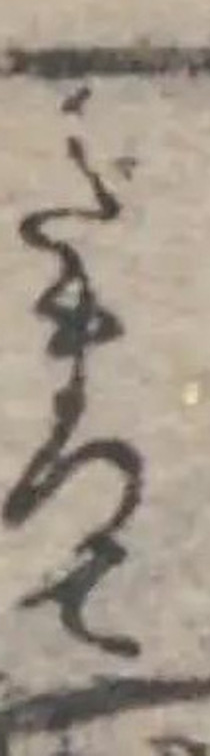だまつて
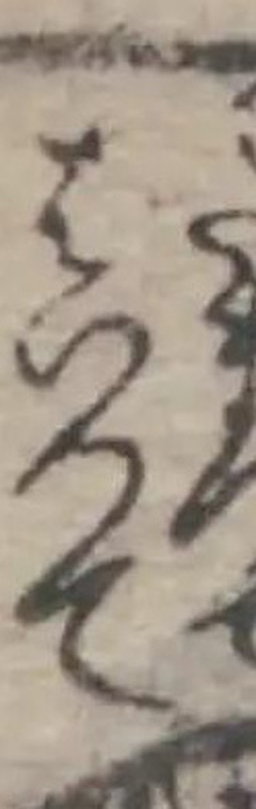はいつて
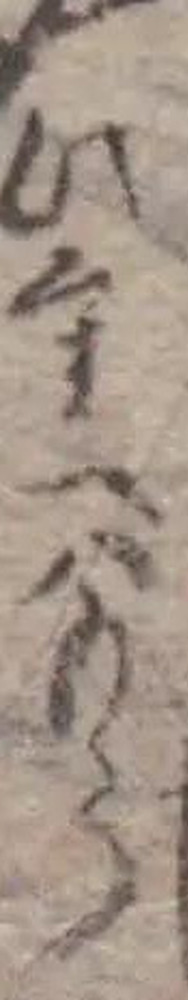此重へはもう
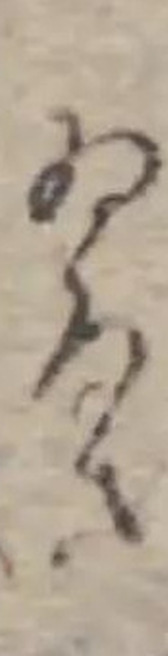ゐなさ

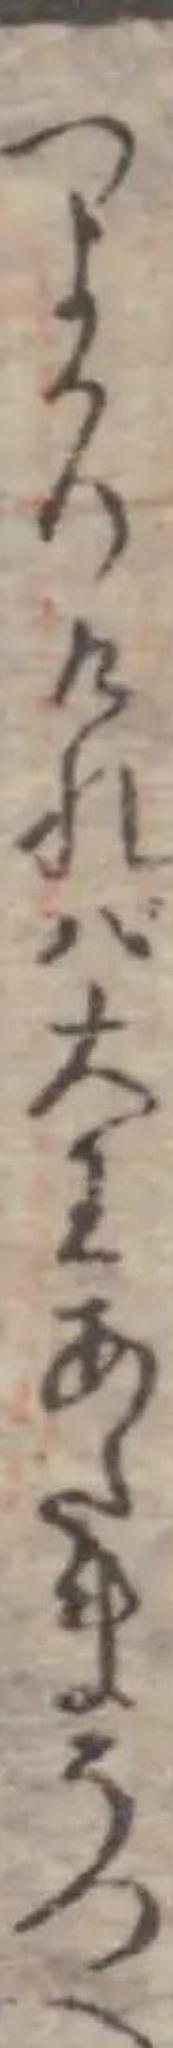つよかりければ大王あたまうつ
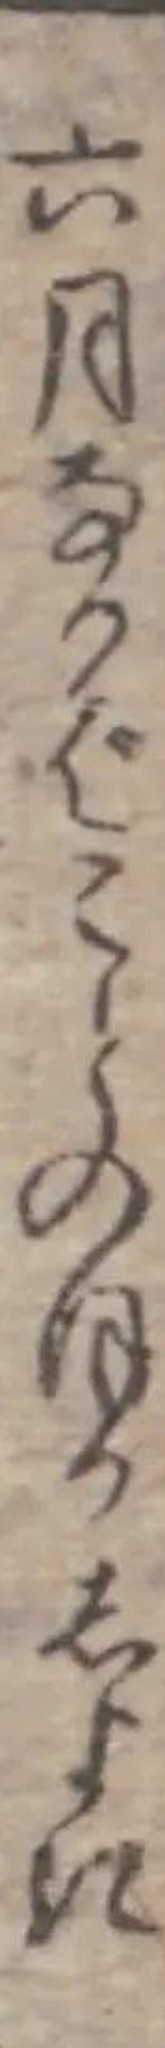六月なかばことのほかしよき
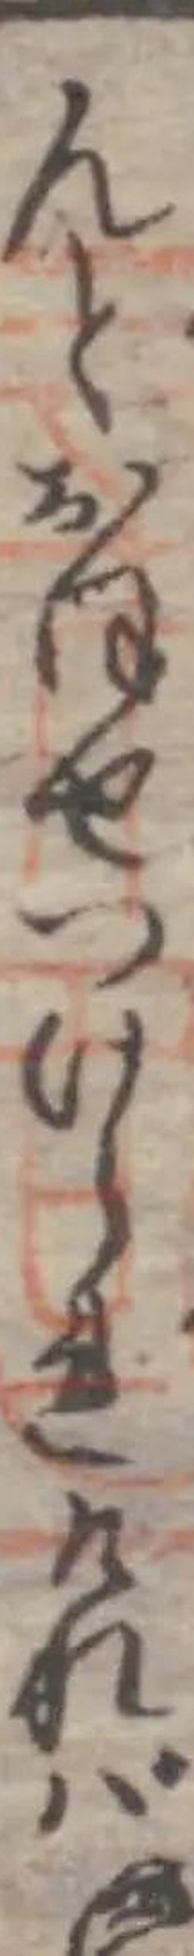んとおほせつけられければ
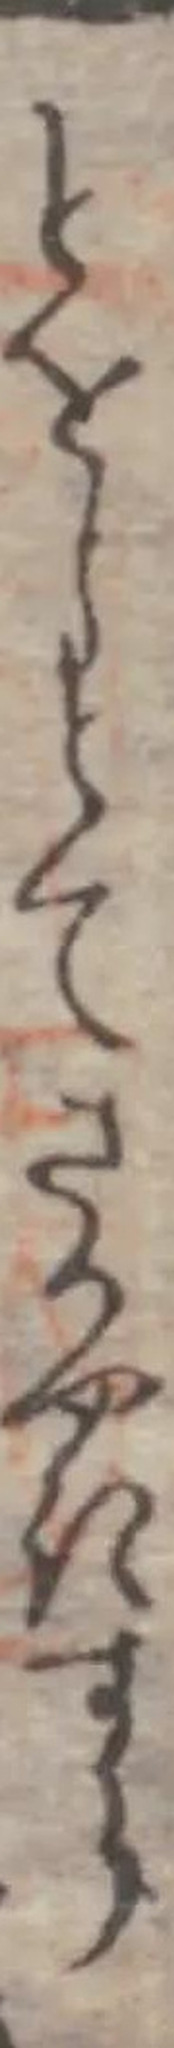とをしとてさかやきすら
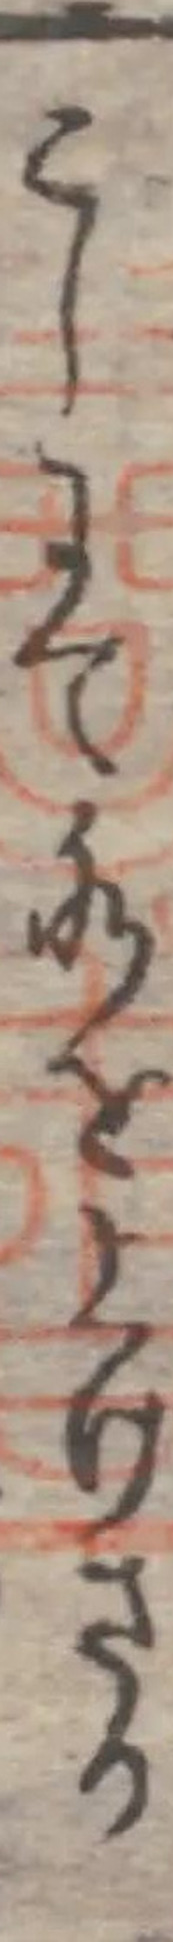こしにて水を上けさか
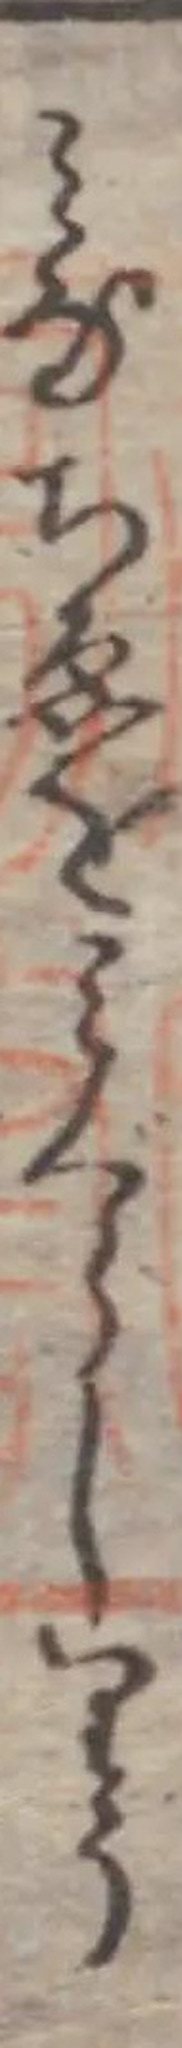みなちゑをみぐらしりう
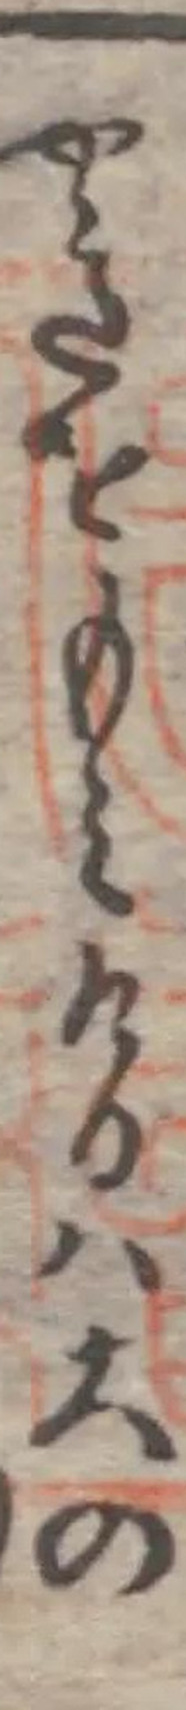やきをもみけるは大の
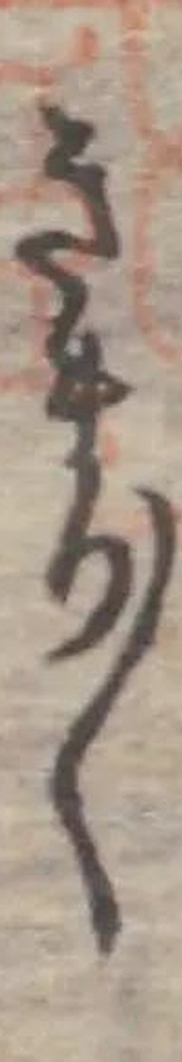きまり〳〵
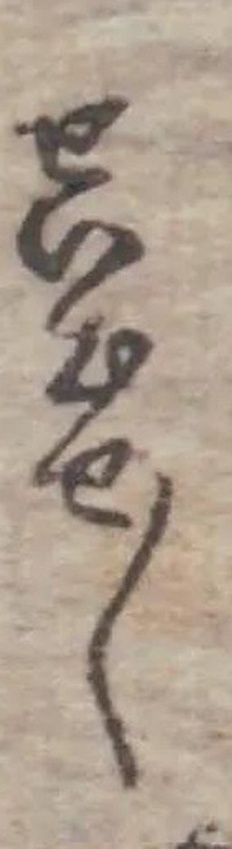せい出せ〳〵
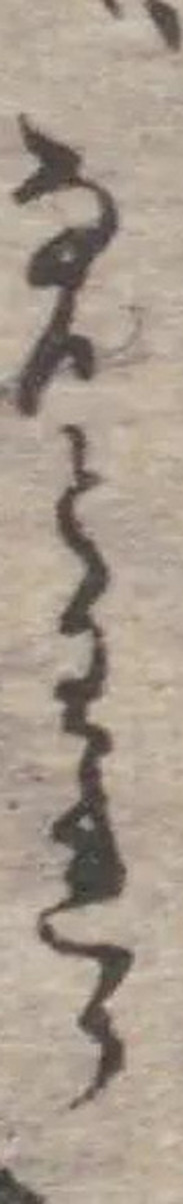なんとわれら
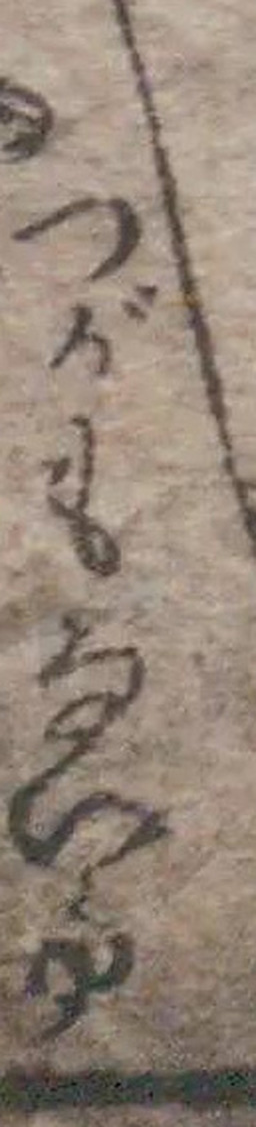つがもない事
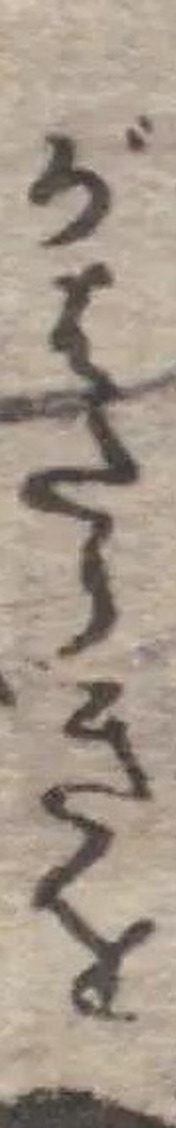がはたらきを
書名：五たいそう
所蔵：国立国会図書館 National Diet Library, JAPAN
